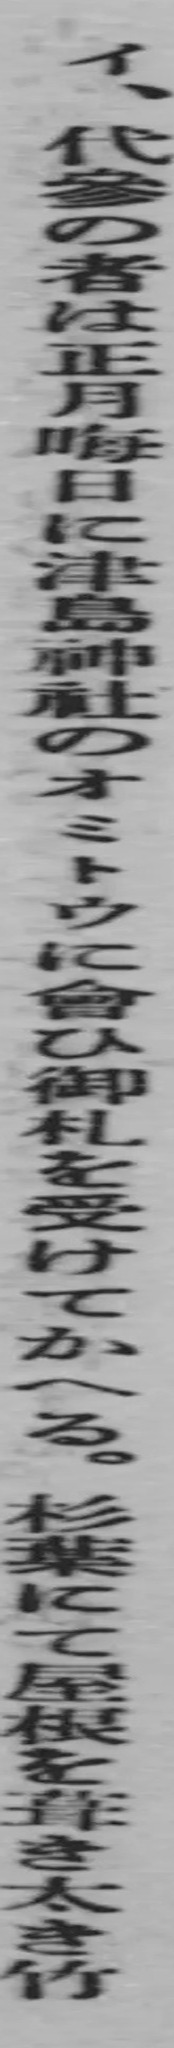イ、代參の者は正月晦日に津島神社のオミトウに會ひ御札を受けてかへる。杉葉にて屋根を葺き太き竹
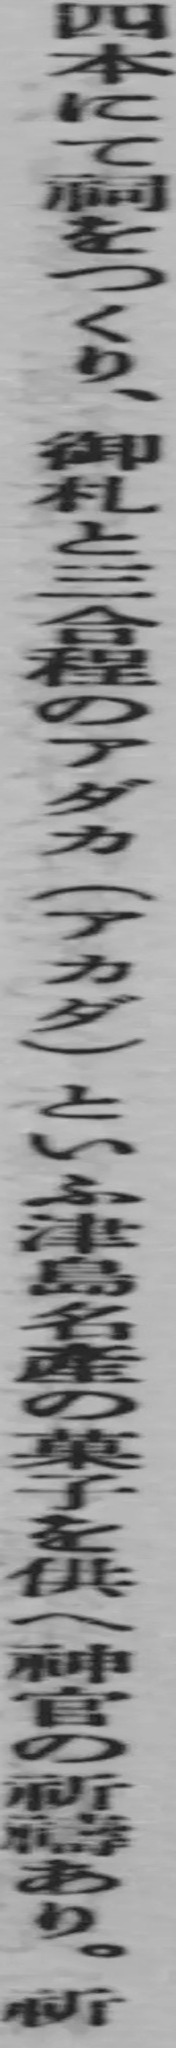四本にて祠をつくり、御札と三合程のアダカ(アカダ)といふ津島名產の菓子を供へ神官の祈禱あり、祈
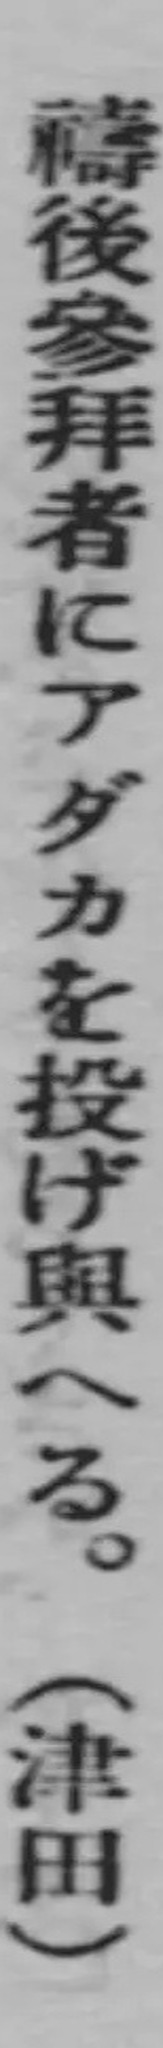禱後參拜者にアダカを投げ與へる。(津田)
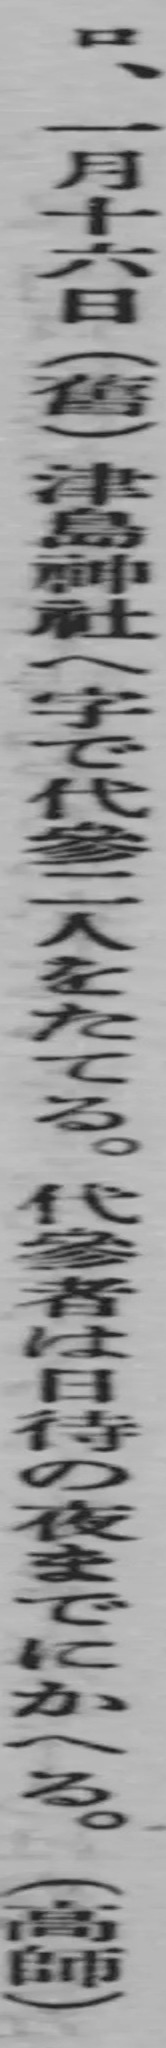ロ、一月十六日(舊)津島神社へ字で代參二人をたてる。代參者は日待の夜までにかへる。(高師)
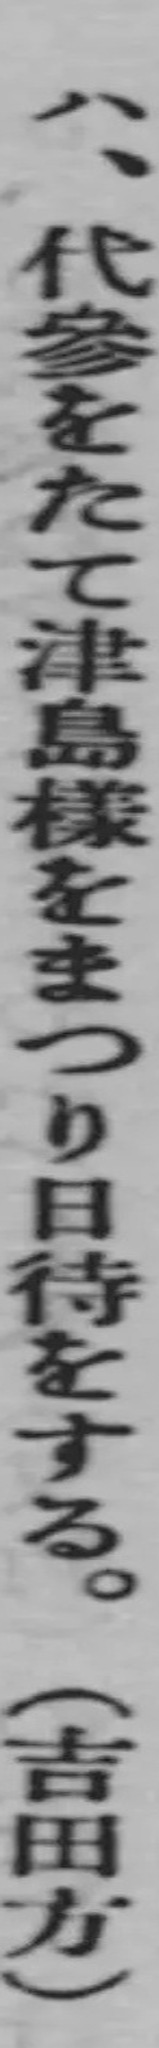ハ、代參をたて津島様をまつり日待をする。(吉田方)
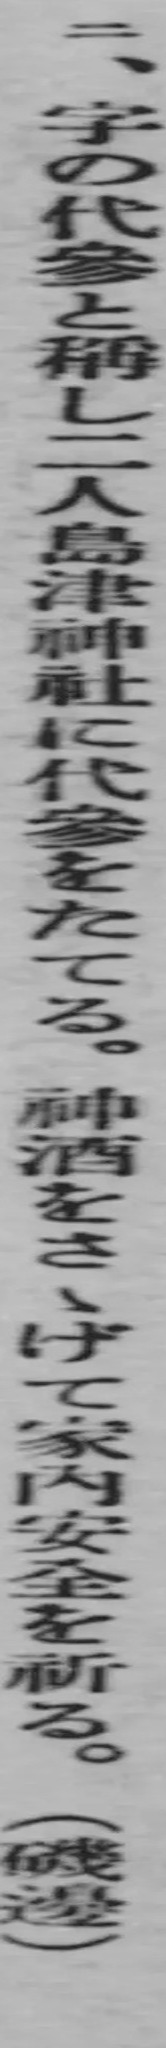ニ、字の代參と稱し二人島津神社に代參をたてる。神酒をさゝげて家内安全を祈る。(磯邊)
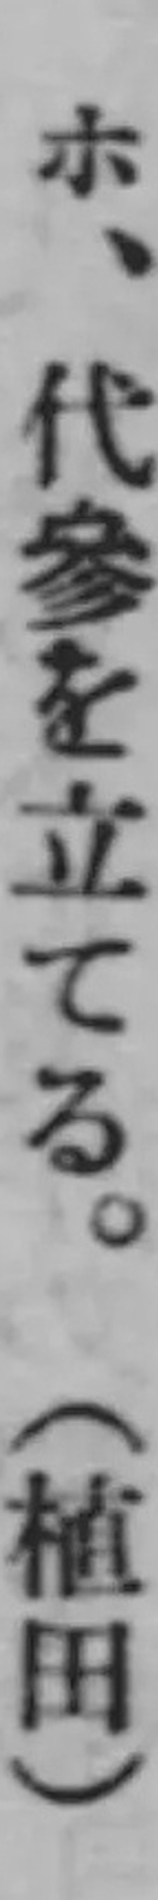ホ、代參を立てる。(植田)
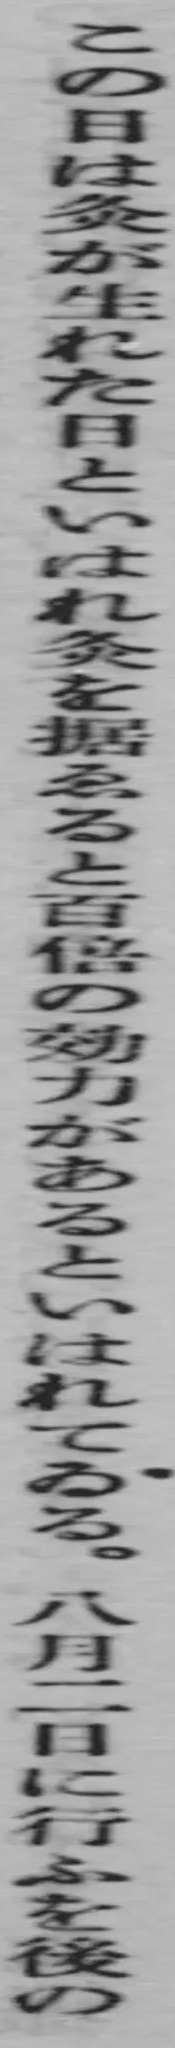この日は灸が生れた日といはれ灸を据ゑると百倍の効力があるといはれてゐる。八月二日に行ふを後の
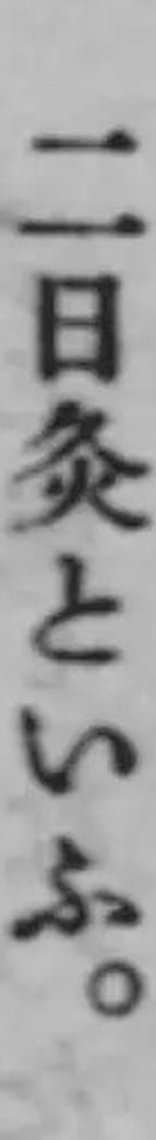二日灸といふ。
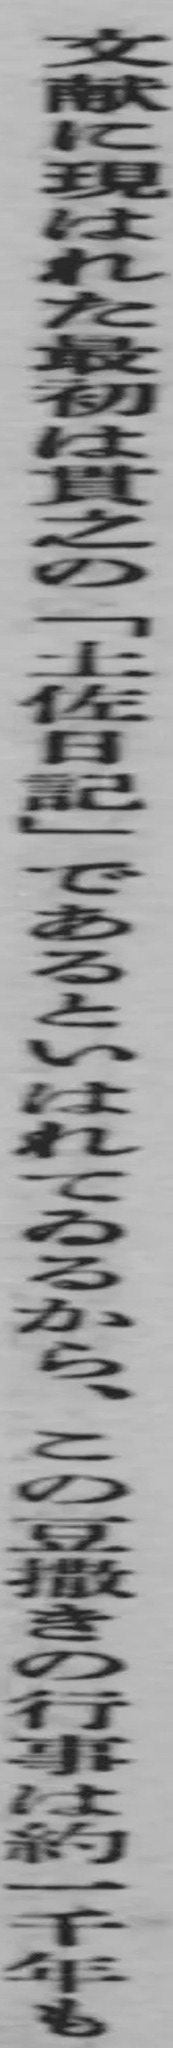文献に現はれた最初は貫之の「土佐日記」であるといはれてゐるから、この豆撒きの行事は約一千年も

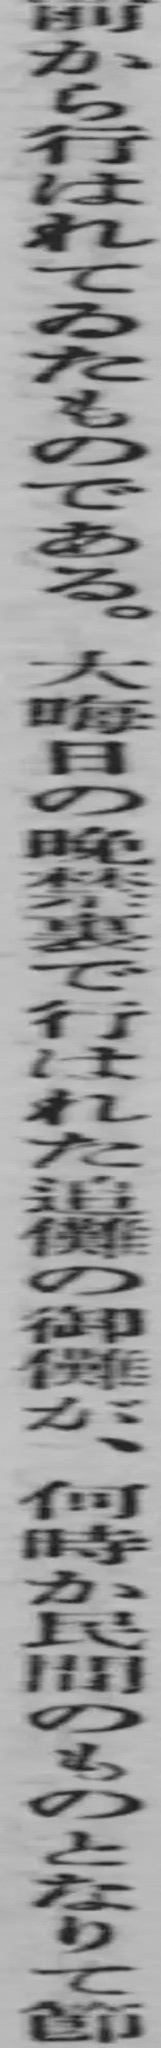前から行はれてゐたものである。大晦日の晩禁裏で行はれた追儺の御儺が、何時か民間のものとなりて節
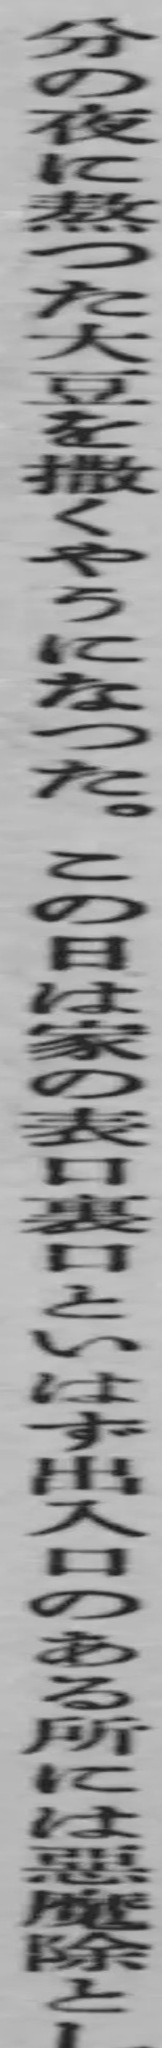分の夜に熬つた大豆を撒くやうになつた。この日は家の表口裏口といはず出入口のある所には惡魔除とし
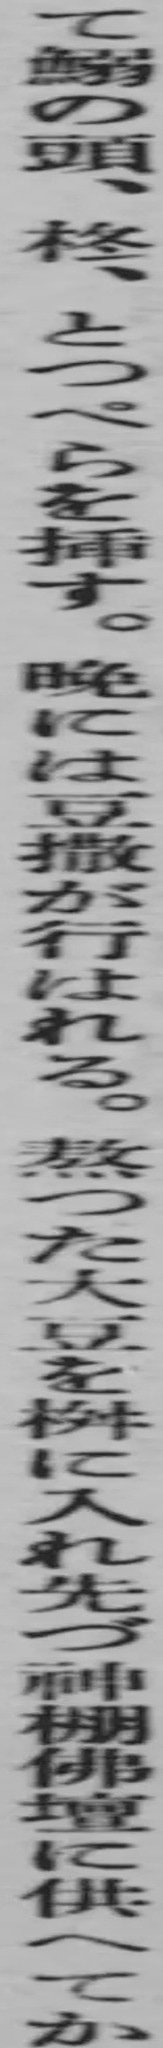て鰯の頭、柊、とつぺらを挿す。晩には豆撒が行はれる。熬つた大豆を桝に入れ先づ神棚佛檀に供へてか
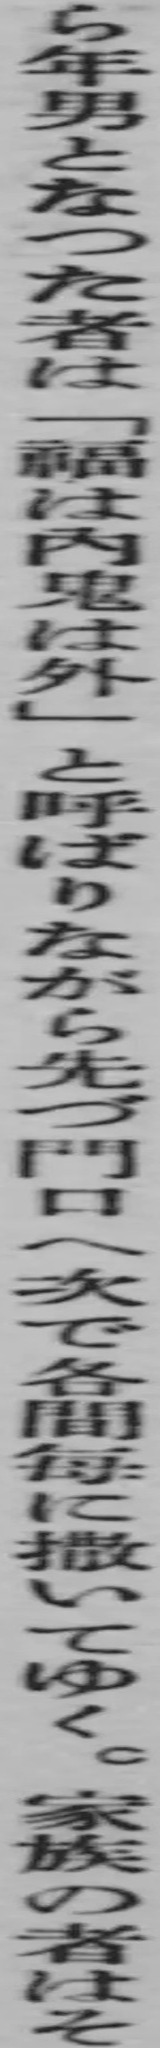ら年男となつた者は「福は内鬼は外」と呼ばりながら先づ門口へ次で各間每に撒いてゆく。家族の者はそ
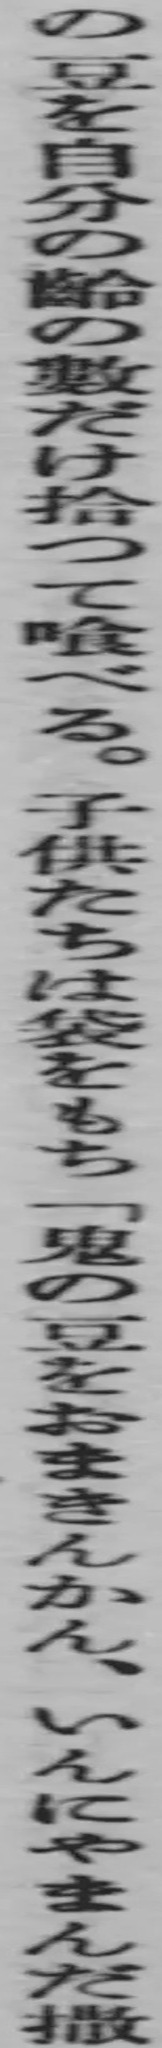の豆を自分の齢の數だけ拾つて喰べる。子供たちは袋をもち「鬼の豆をおまきんかん、いんにやまんだ撒
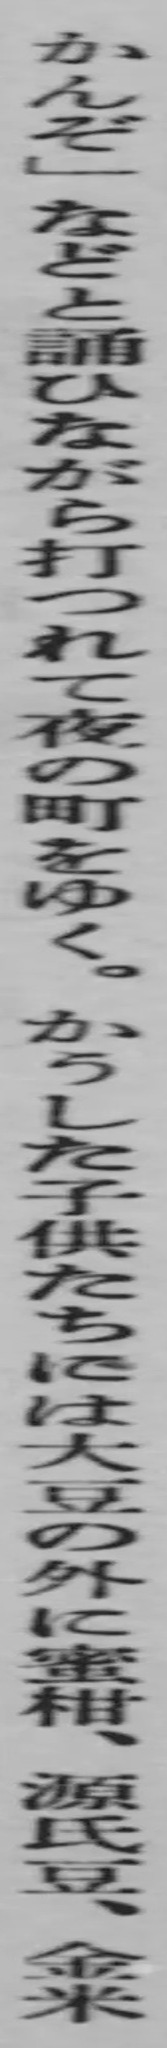かんぞ」などと誦ひながら打つれて夜の町をゆく。かうした子供たちには大豆の外に蜜柑、源氏豆、金平
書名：豊橋の年中行事
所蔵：国立国会図書館 National Diet Library, JAPAN
